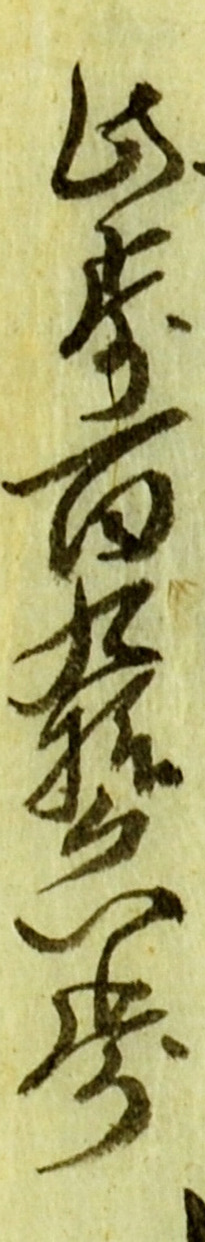此歩百九拾六歩

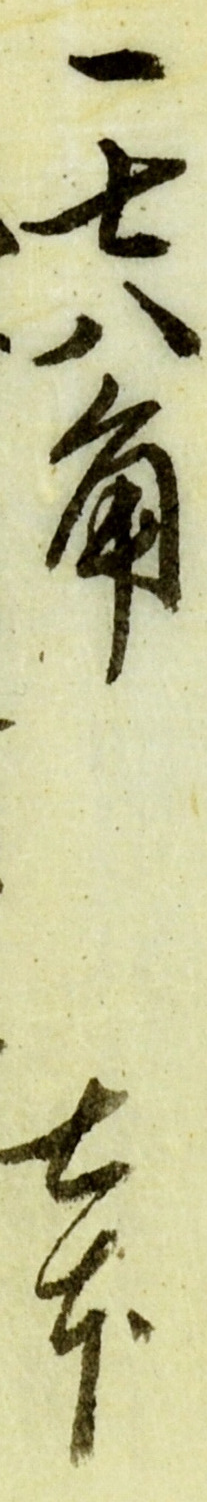一七八角七本
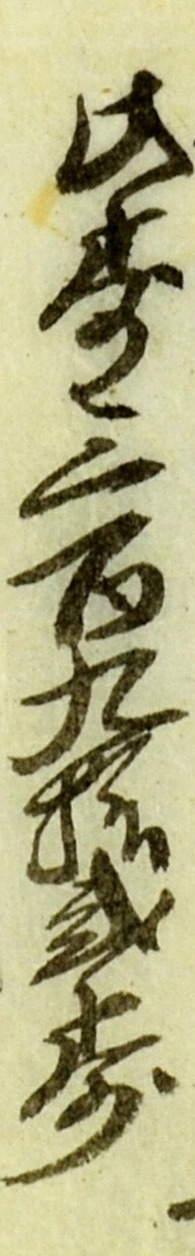此歩三百九拾弐歩
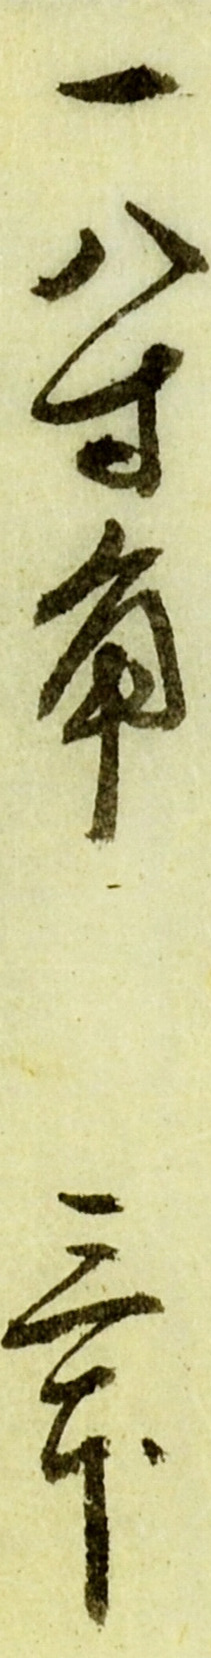一八寸角三本
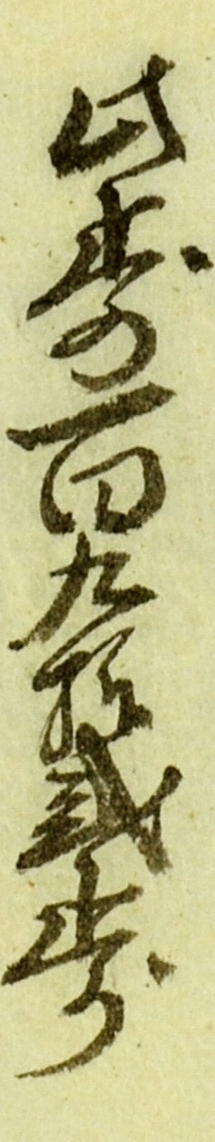此歩百九拾弐歩
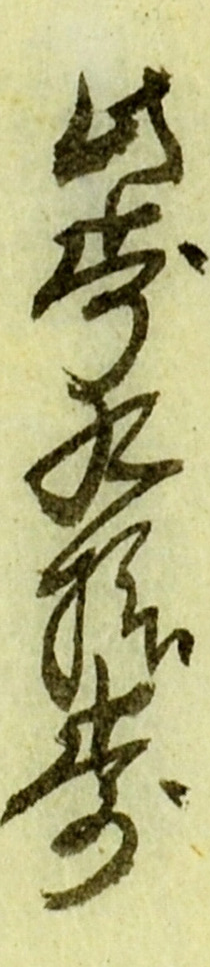此歩九拾歩
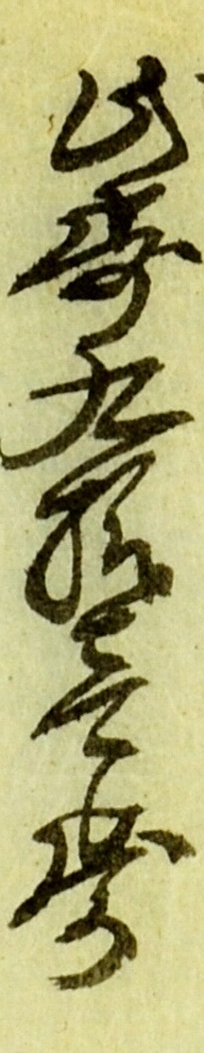此歩九拾壱歩
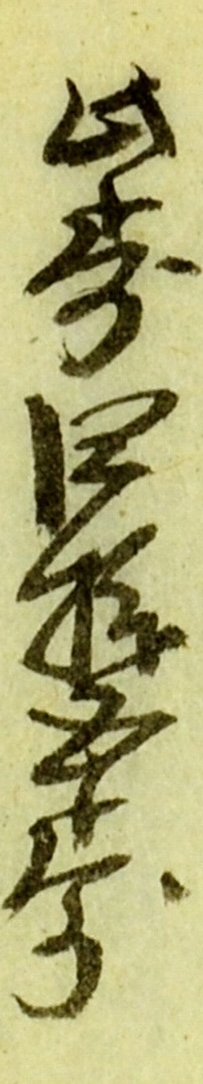此歩四拾五歩
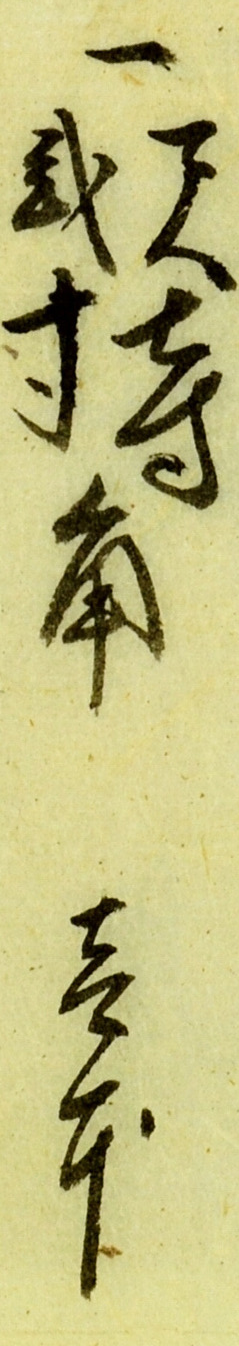一八寸角三本
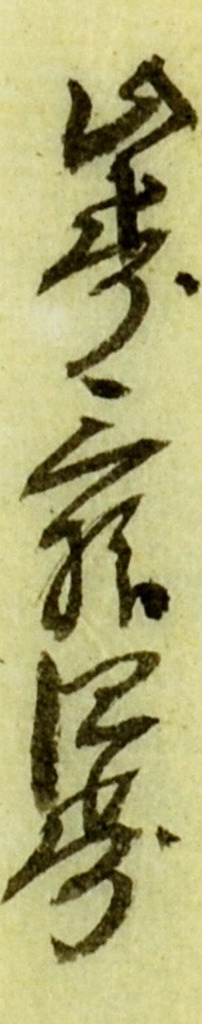此歩三拾四歩

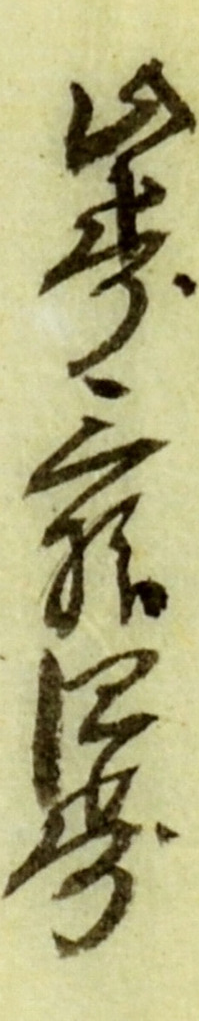此歩三拾四歩
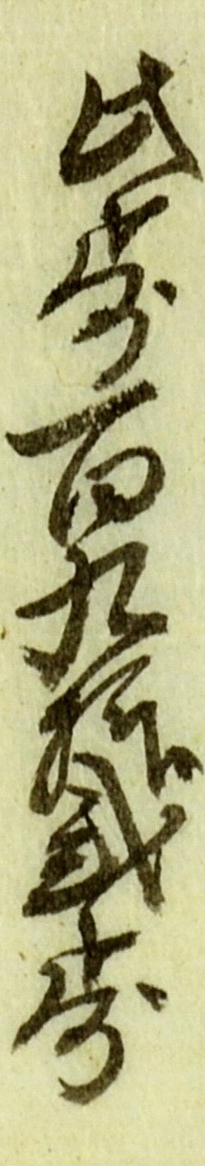此歩百九拾弐歩
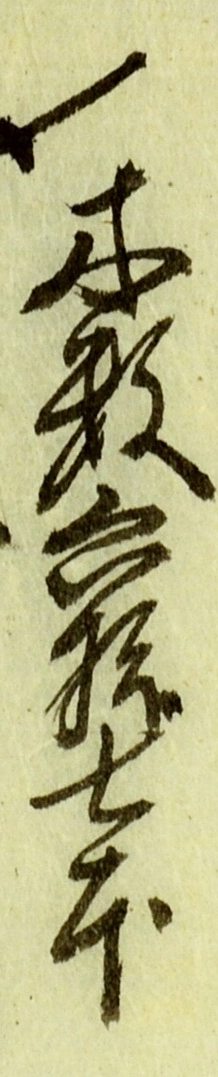木数六拾七本
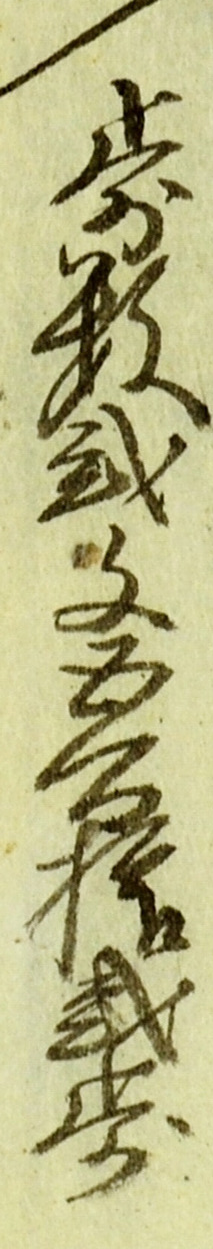〆歩数弐千五百拾弐歩
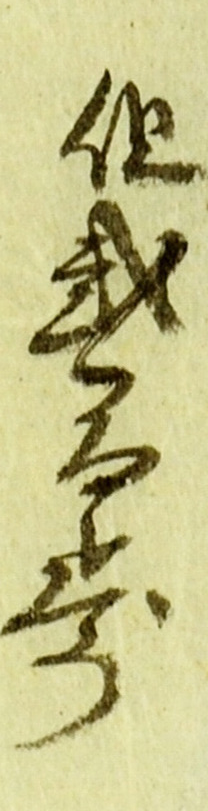但弐間歩
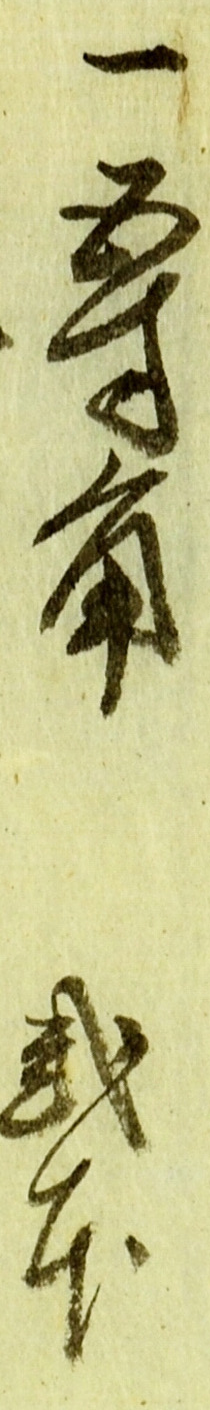一五寸角弐本
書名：材木川下ケ分一上納帳
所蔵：伊那市立高遠町図書館・合同会社AMANE
